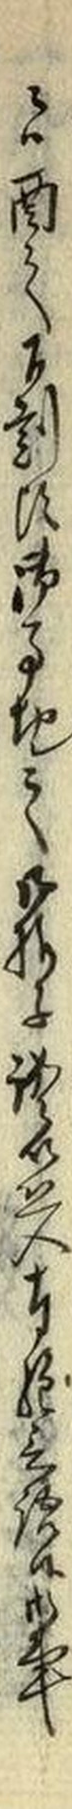ニハ酉之下刻頃御事切レ之御様子誠以恐入奉絶言語候御事
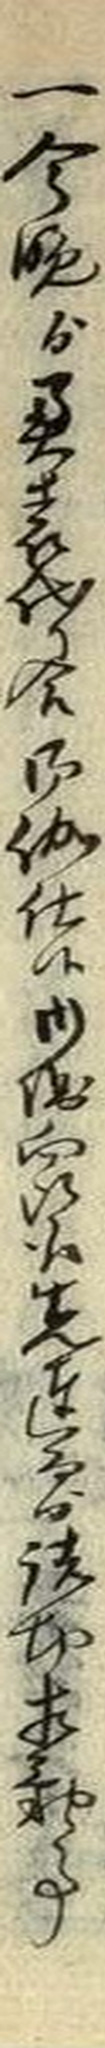一今晩ゟ奥表代り合御伽仕候御側向頭取先達而ゟ詰切相勤候事
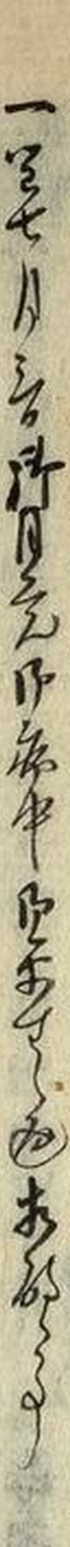一閏七月三日御目覚御病中御平生之通相触候事
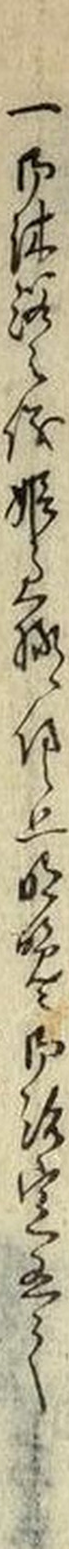一御沐浴之儀姫君様へ伺之上明晩と御治定有之
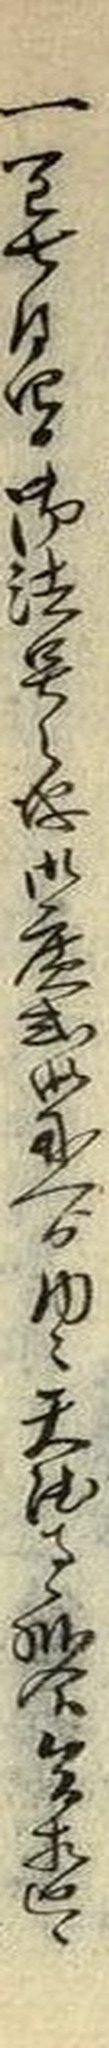一閏七月四日御法号之儀御広式御用人ゟ内々天徳寺へ掛合今日相廻候
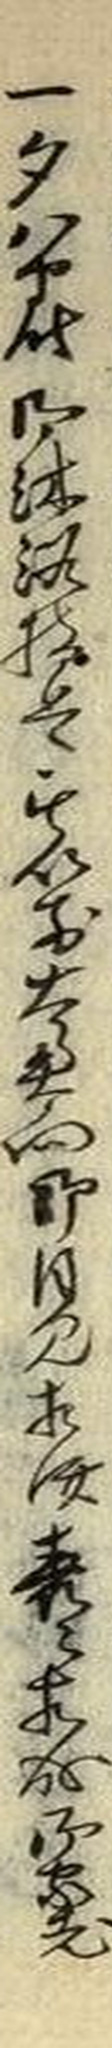一夕八半時御沐浴指上候其以前大奥向御目見相済表ニ相成御家老
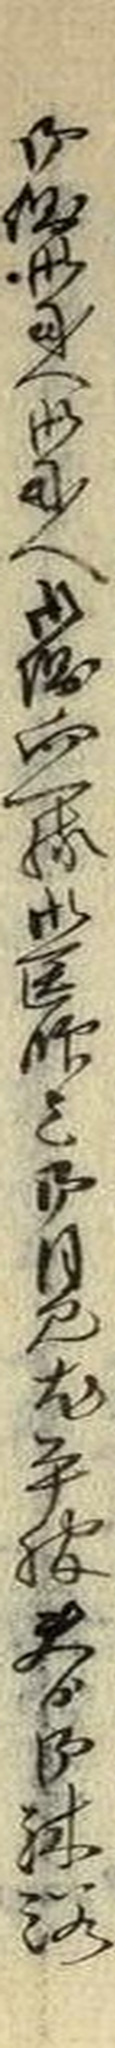御側御用人御用人御側向一統御医師迄御目見尤平服夫ゟ御沐浴
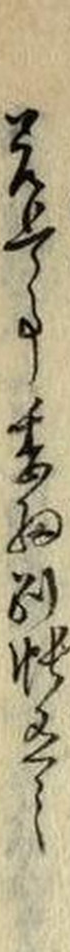差上候事委細別帳有之
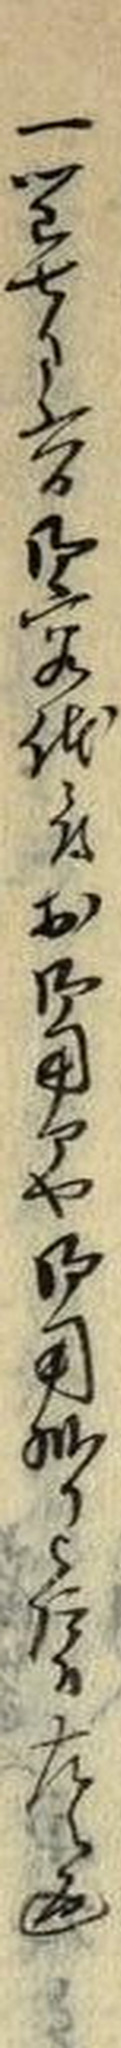一閏七月六日御容体ニ付於御用部や御用掛り被仰付左之通

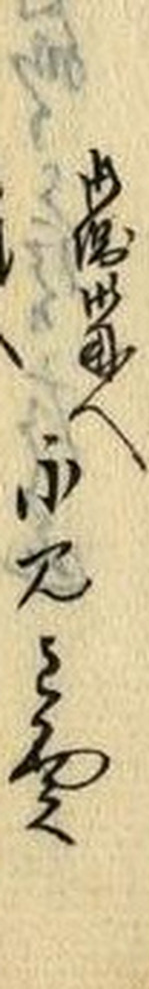御側御用人永見主殿
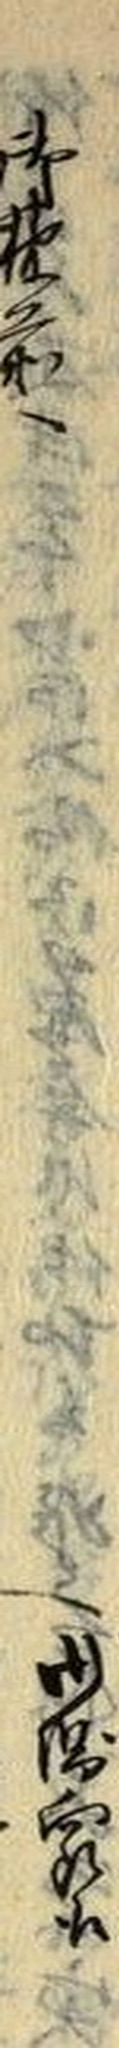御棺前へ御側向頭取
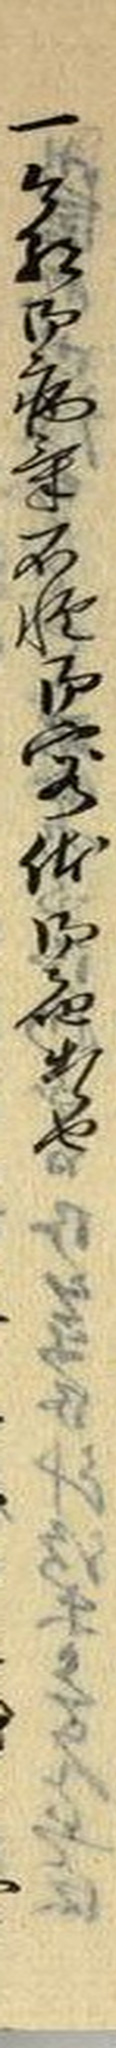一今朝御病気不軽御容体御届出候由
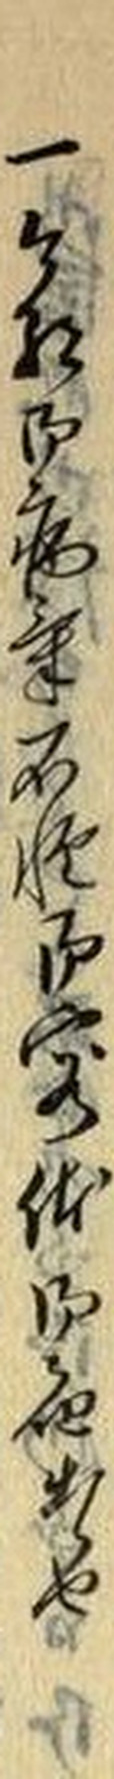一今朝御病気不軽御容体御届出候由
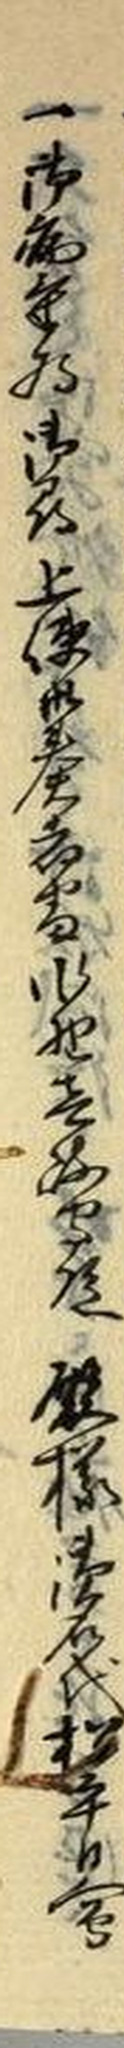一御病気為御尋上使御奏者番水野壱岐守殿殿様御名代松平日向守
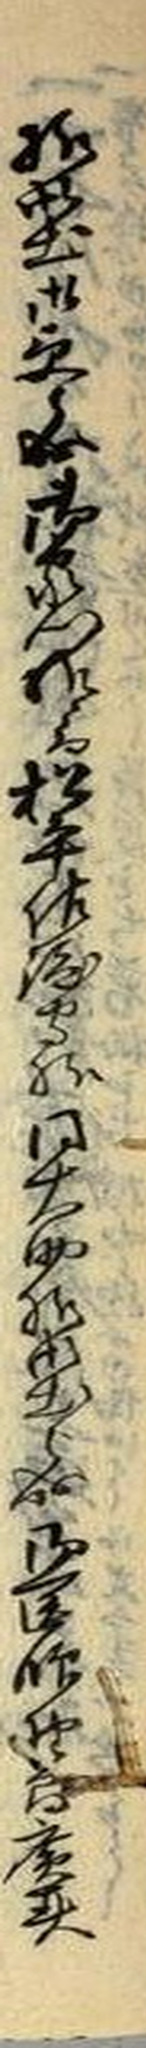様御出御受被成御家門様ニ而松平佐渡守様同大助様御出被成御医師野間広春
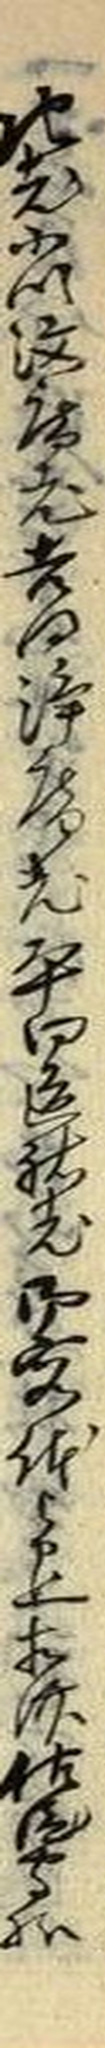院老小川汶庵老吉田浄庵老平田道祐老御容体被申上相済佐渡守様
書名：少傅日録抄（斉承付側向頭取日記、在府）
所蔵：福井県文書館 Fukui Prefectural Archives
